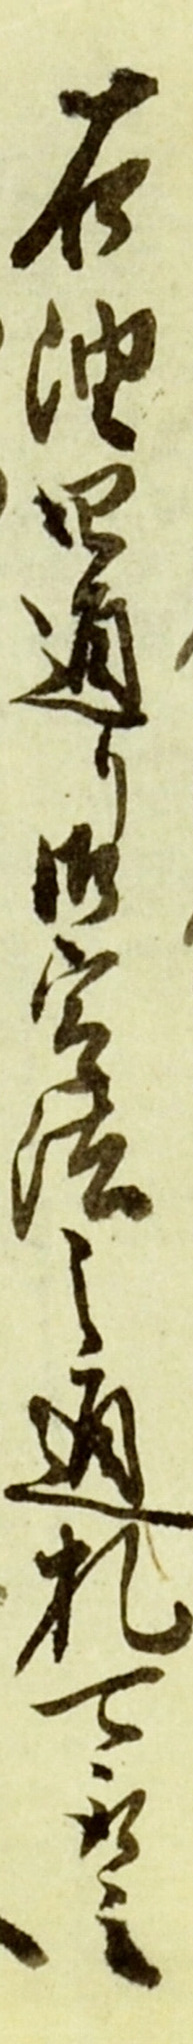右油四通り御定法之通札可取之
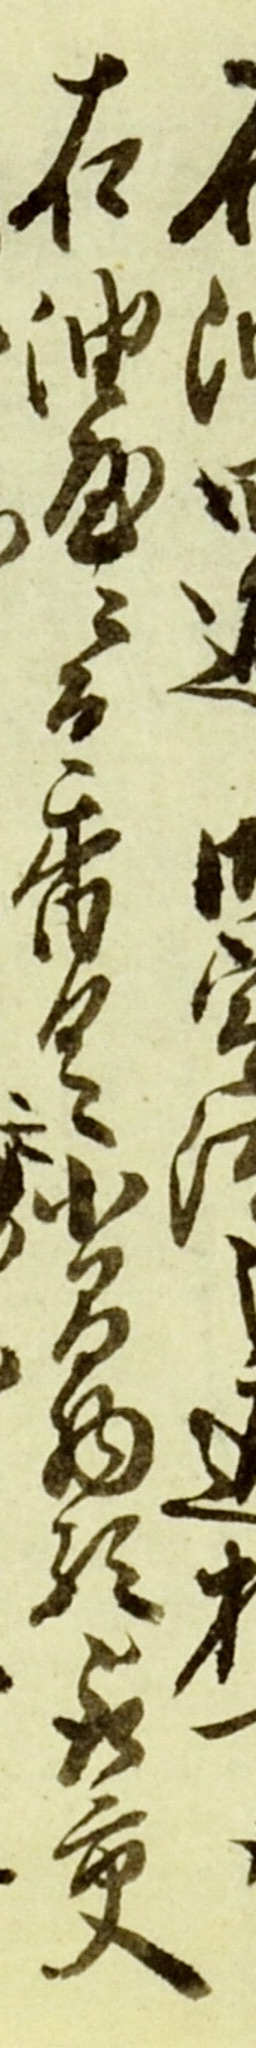右油屋ニ而香具小間物類取交
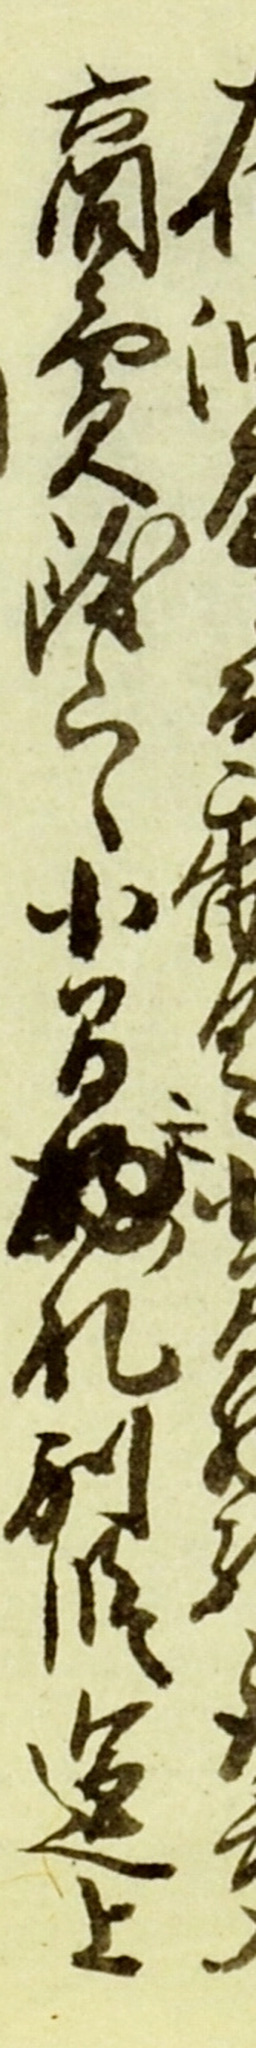商売致候ハゝ小間物札別段運上
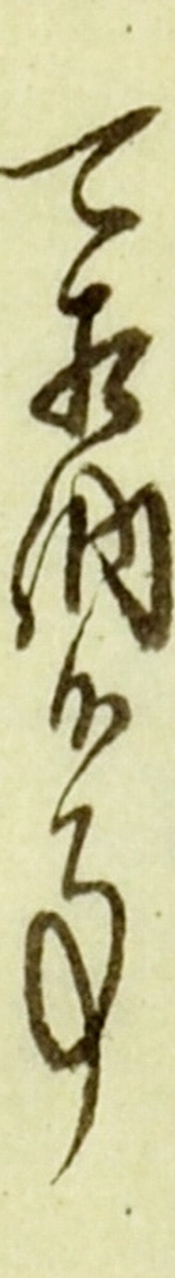可相納候事
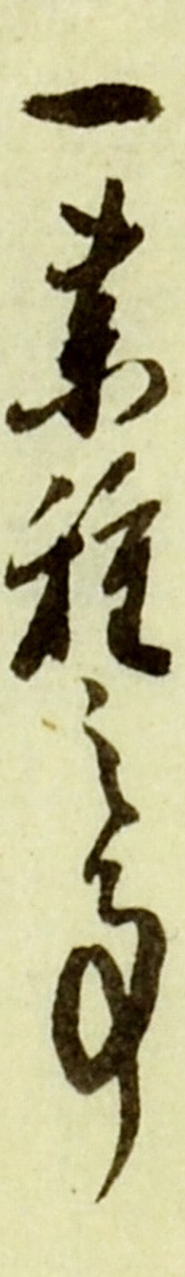一薬種之事
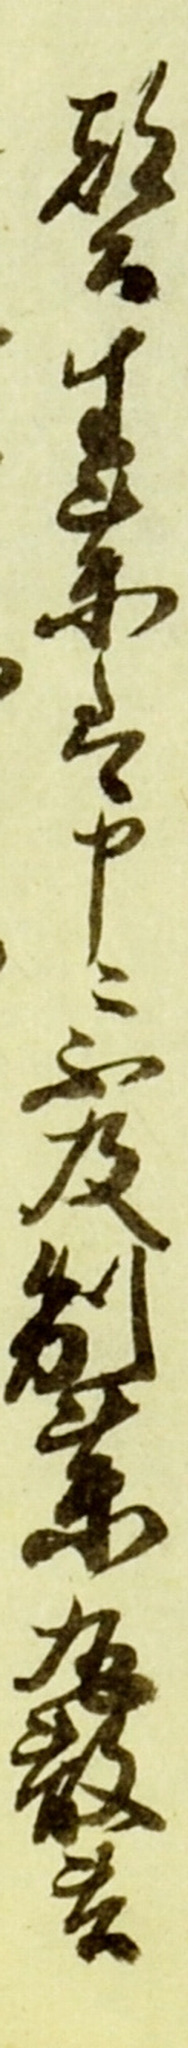都而生薬は申ニ不及制薬丸薬共
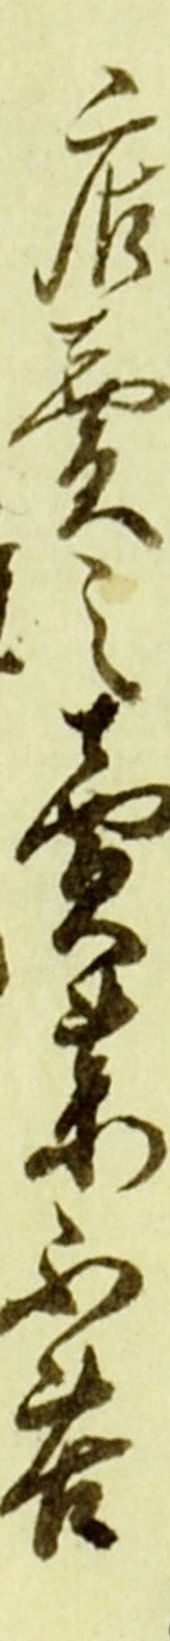店売之は売薬不苦
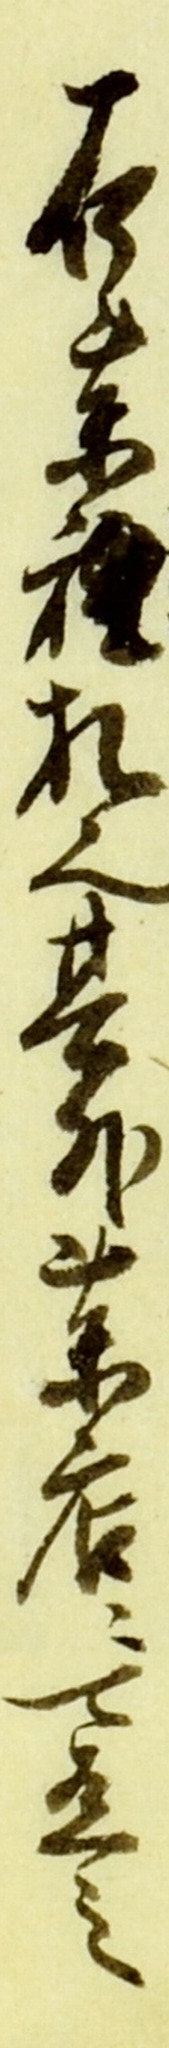右薬種札也其外薬店ニ可有之
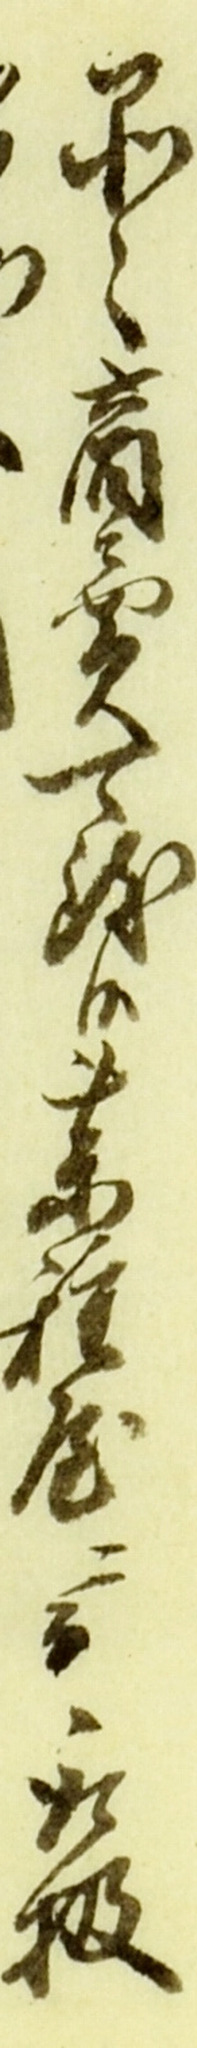品々商売可致候薬種屋ニ而取扱
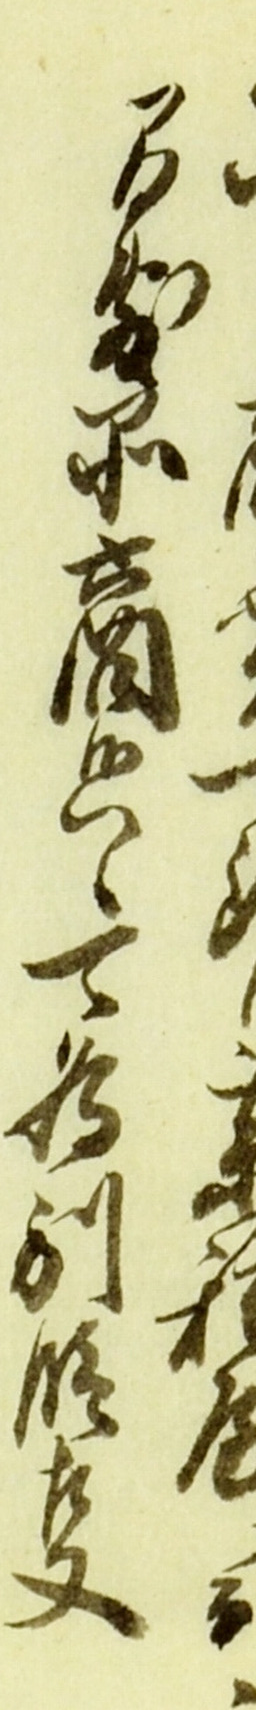間敷品商候ハゝ可為別段事
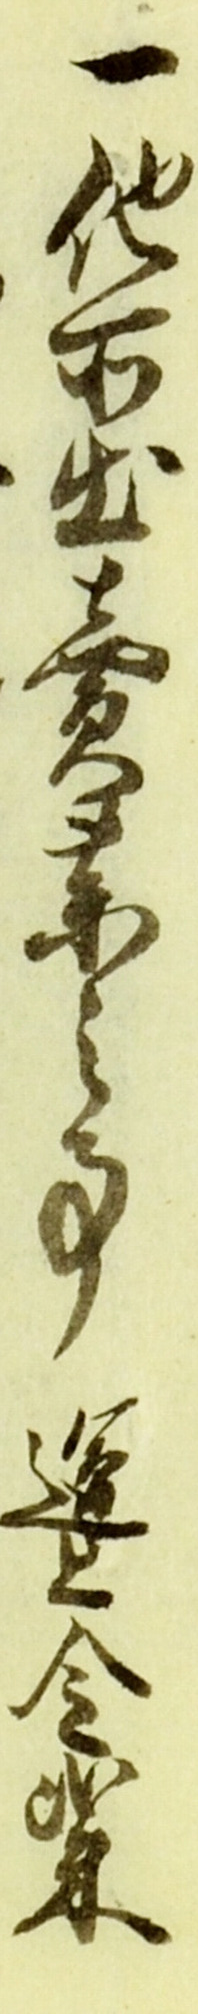一他所出売薬之事運上金弐朱
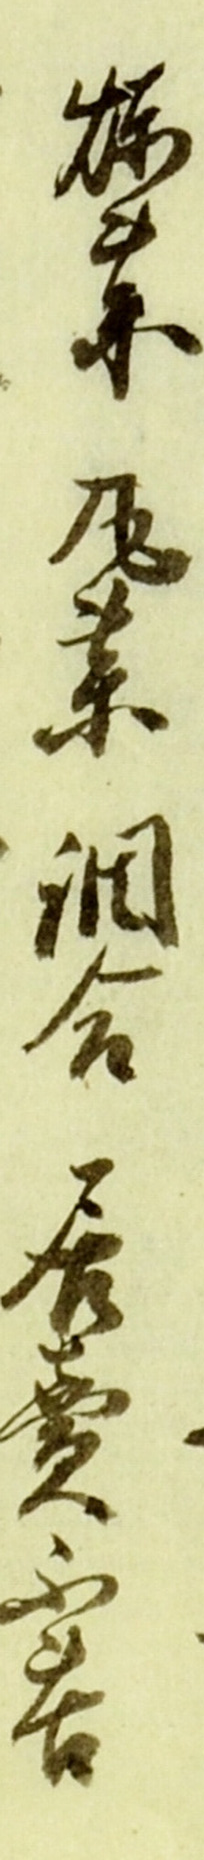煉薬丸薬調合居売不苦
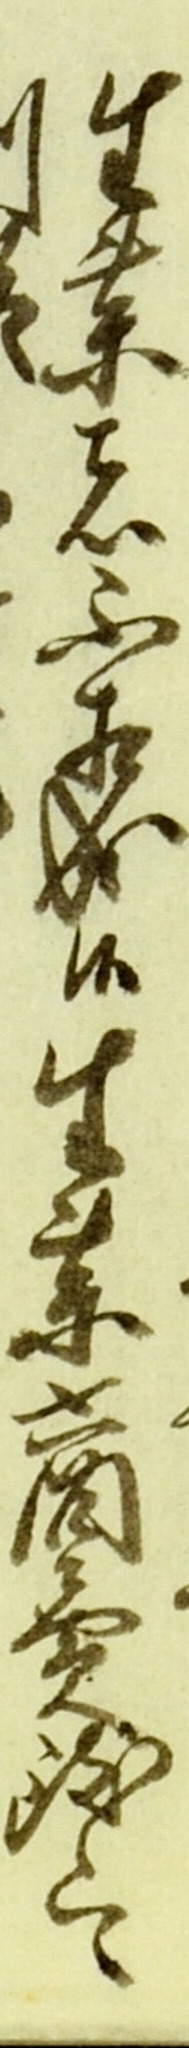生薬者不相成候生薬商売致候ハゝ
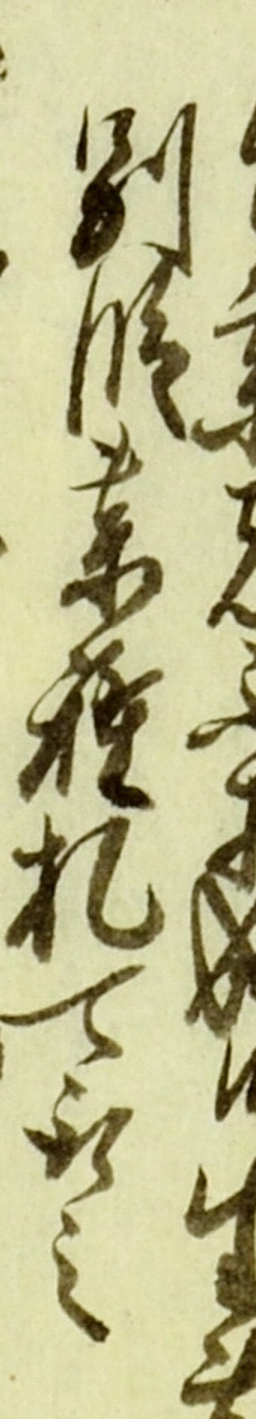別段薬種札可取之
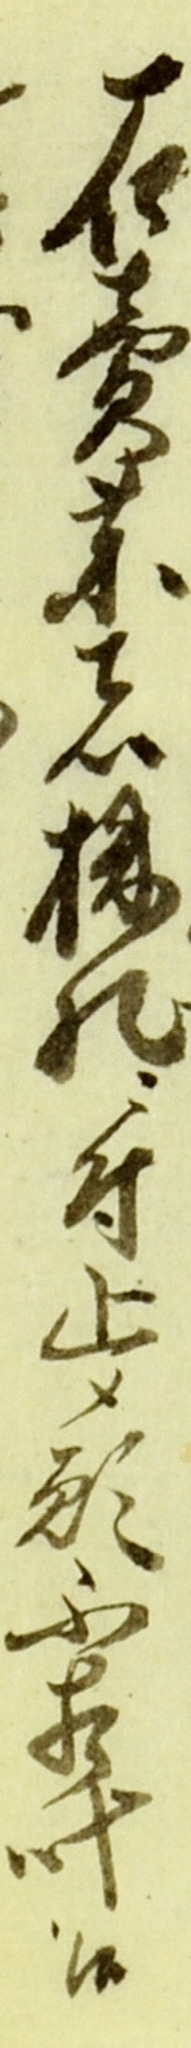右売薬者株札ニ付止メ願不相叶候
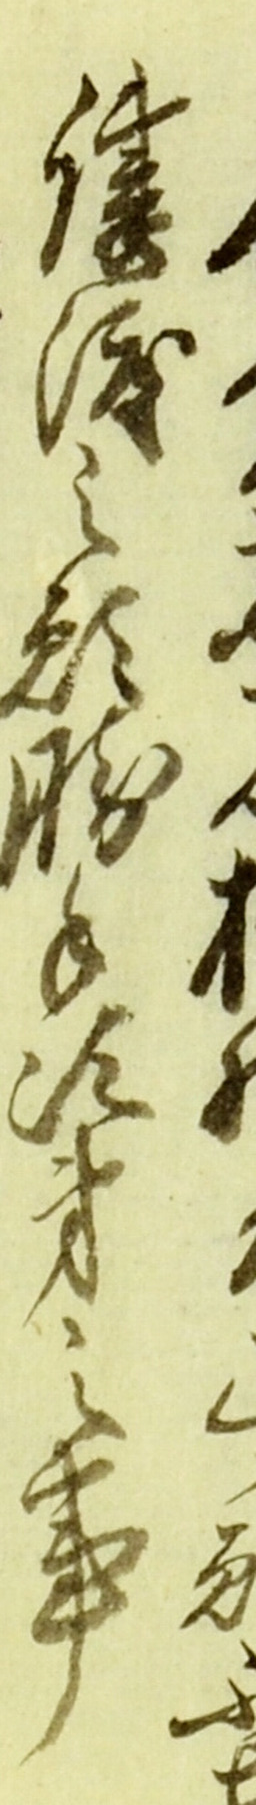譲渡之願勝手次第之こ事
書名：分一方諸運上御定法
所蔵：伊那市立高遠町図書館・合同会社AMANE
